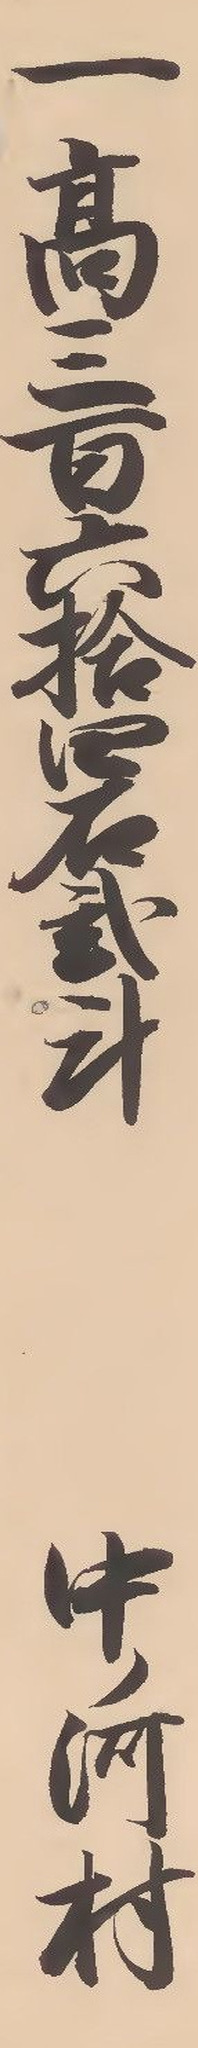一高三百六拾四石弐斗中ノ河村
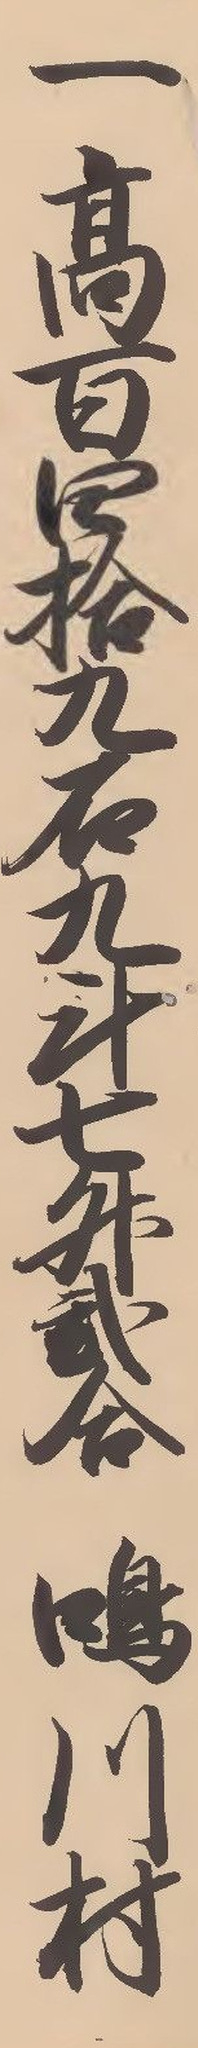一高百四拾九石九斗七升弐合鳴川村
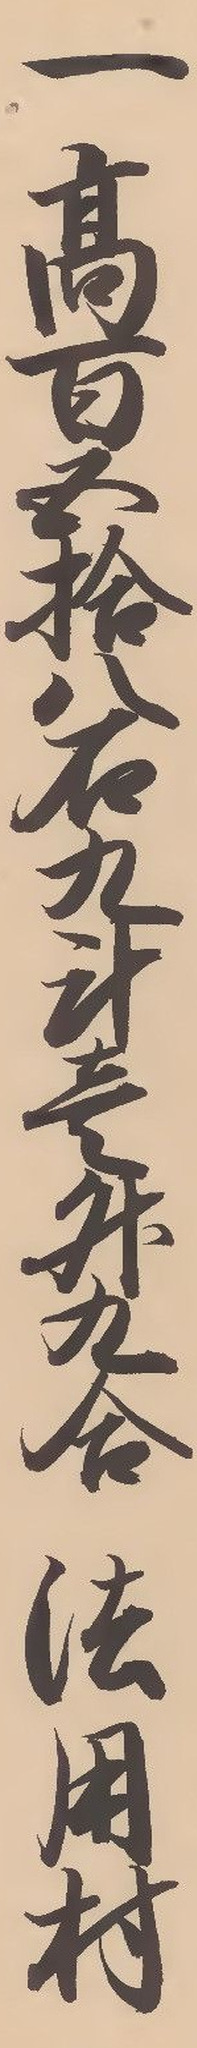一高百五拾八石九斗壱升九合法用村
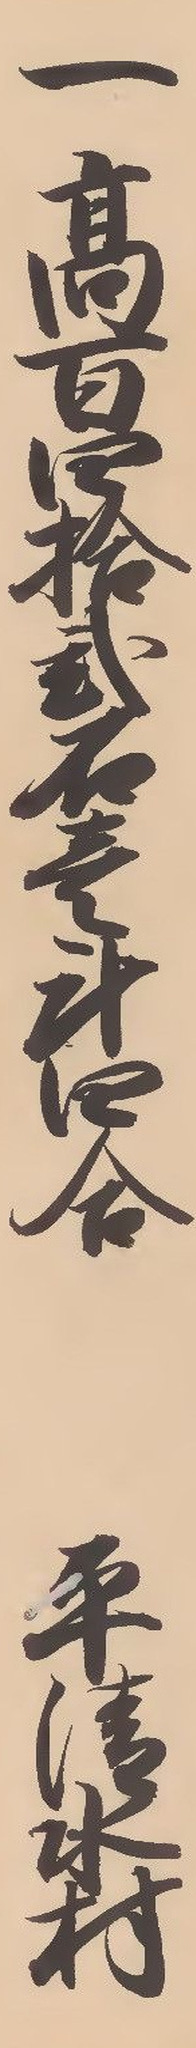一高百四拾弐石壱斗四合平清水村
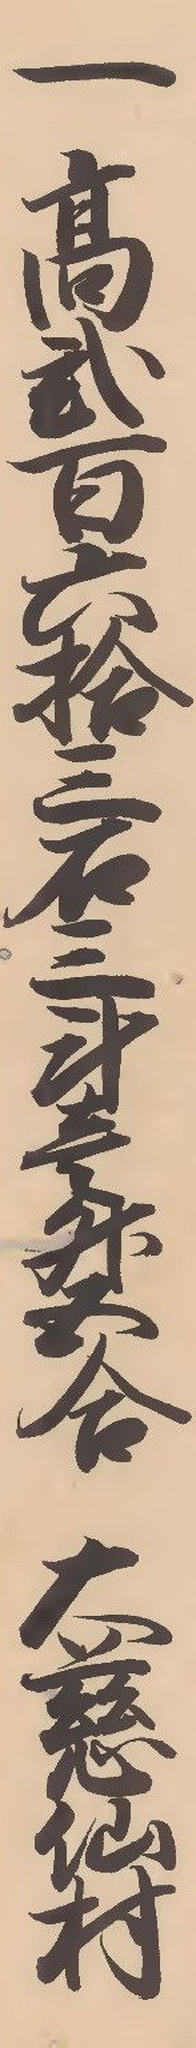一高弐百六拾三石三斗壱升五合大慈仙村

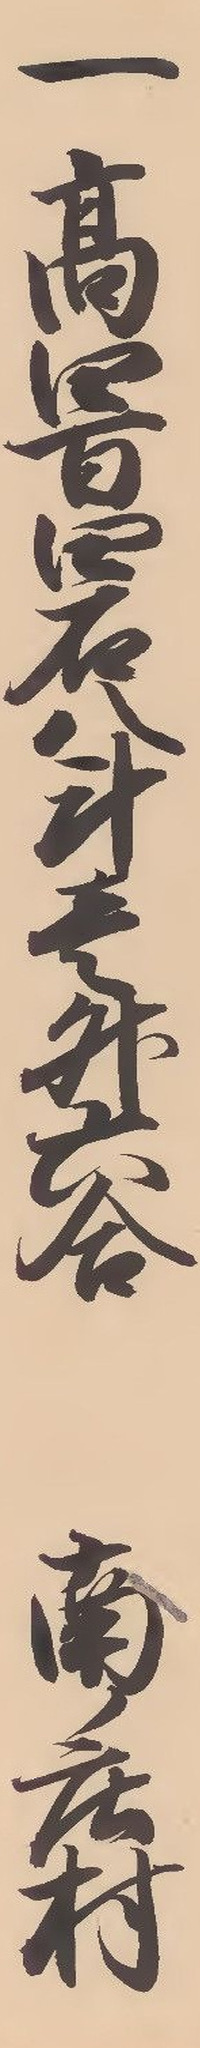一高四百四石八斗壱升六合南ノ庄村
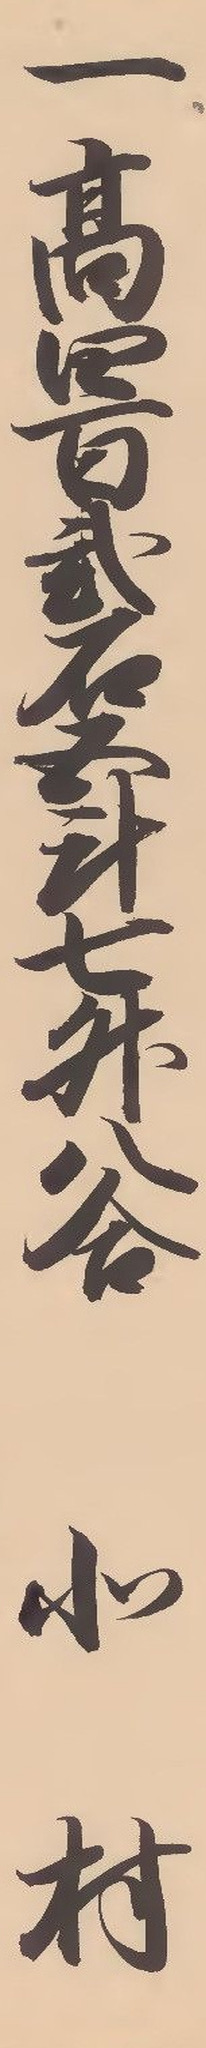一高四百弐石五斗七升八合北村
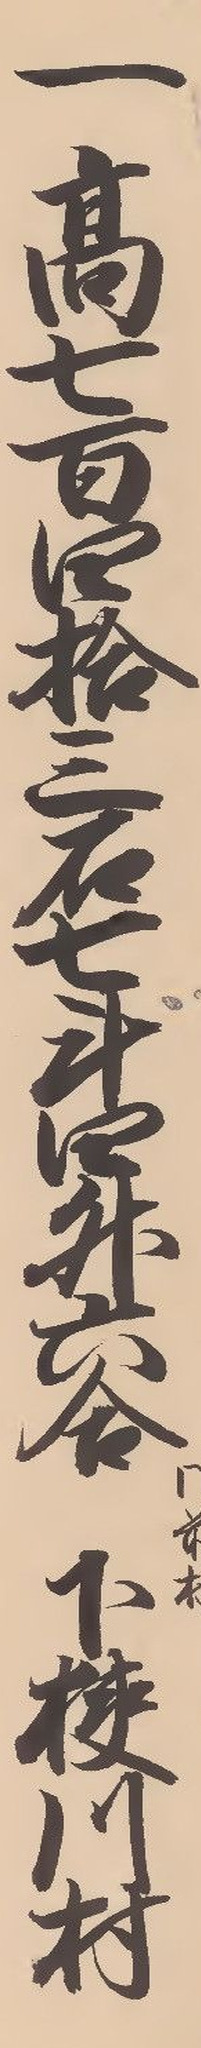一高六百三拾三石七斗八升南須川村
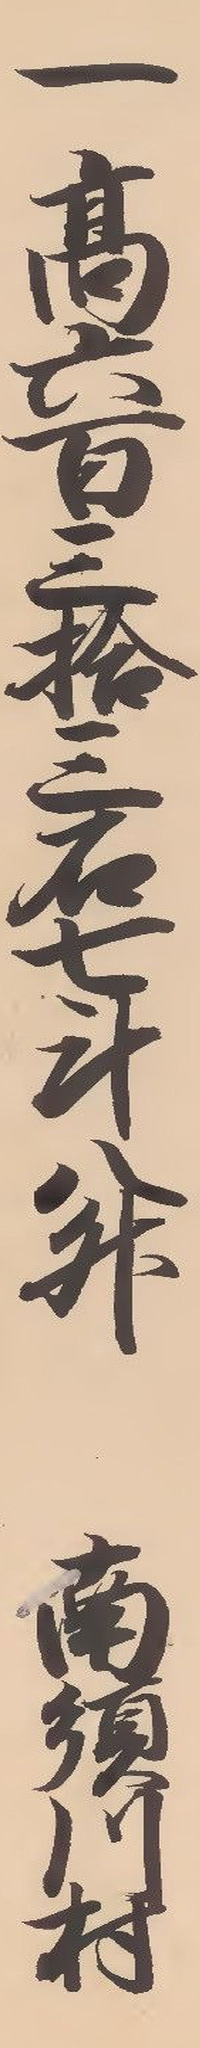一高六百三拾三石七斗八升南須川村
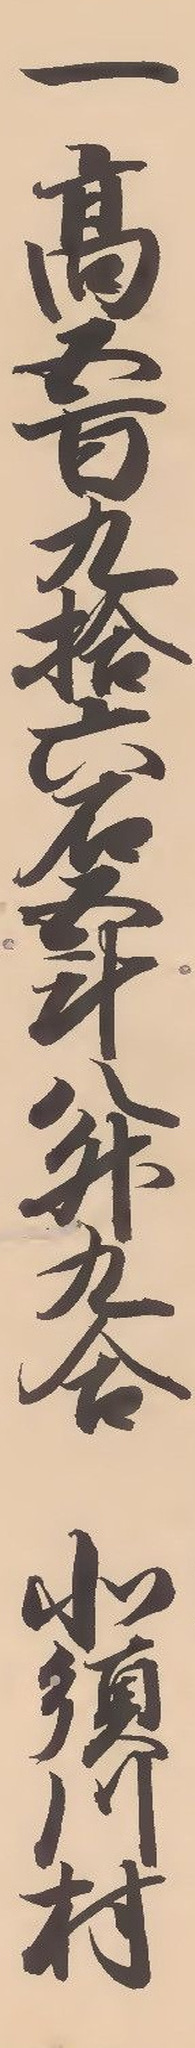一高六百三拾三石七斗八升南須川村

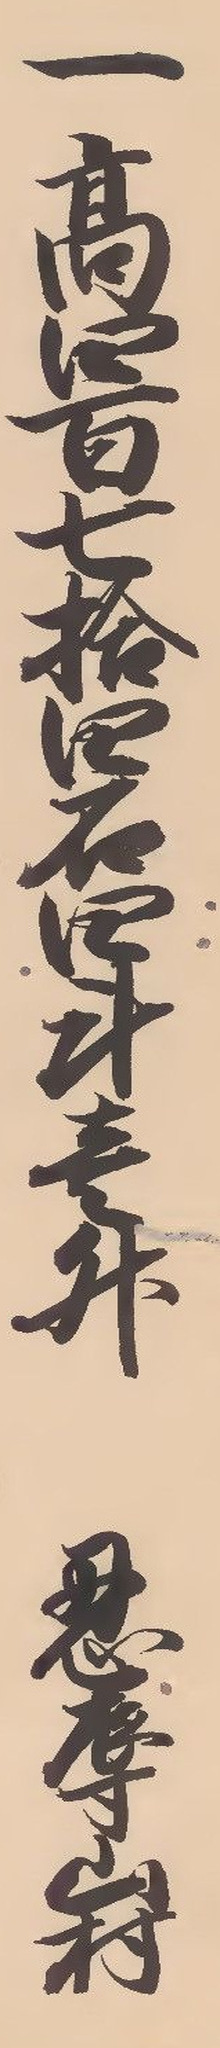一高四百七拾四石四斗壱升忍辱山村
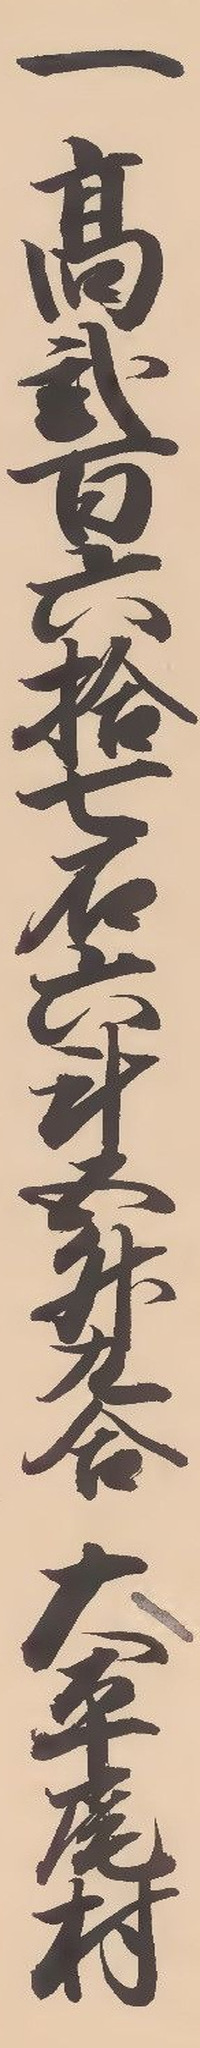一高弐百六拾七石六斗五升九合大平尾村
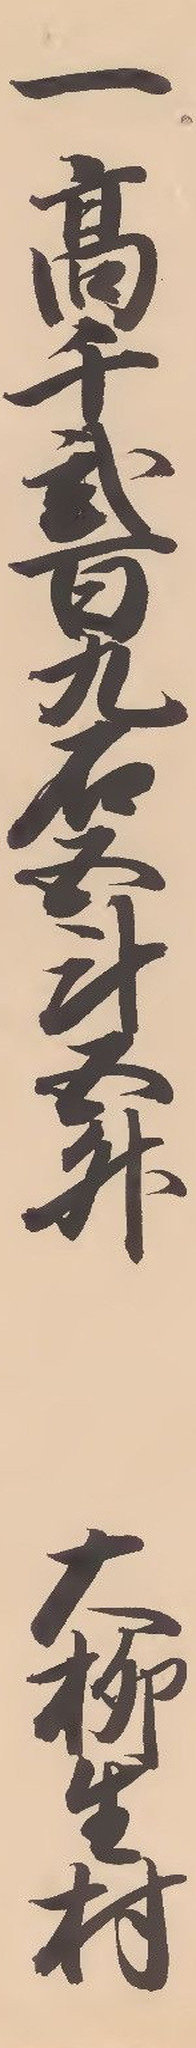一高千弐百九石五斗五升大柳生村
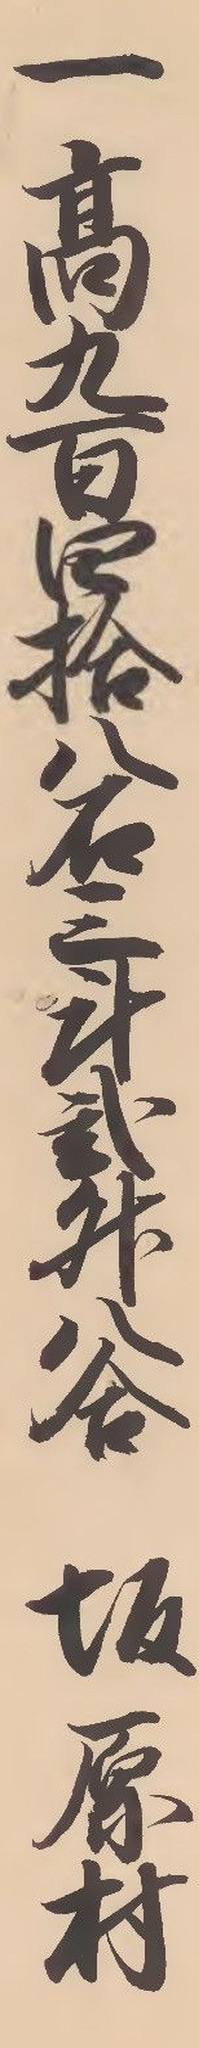一高九百四拾八石三斗弐升八合坂原村
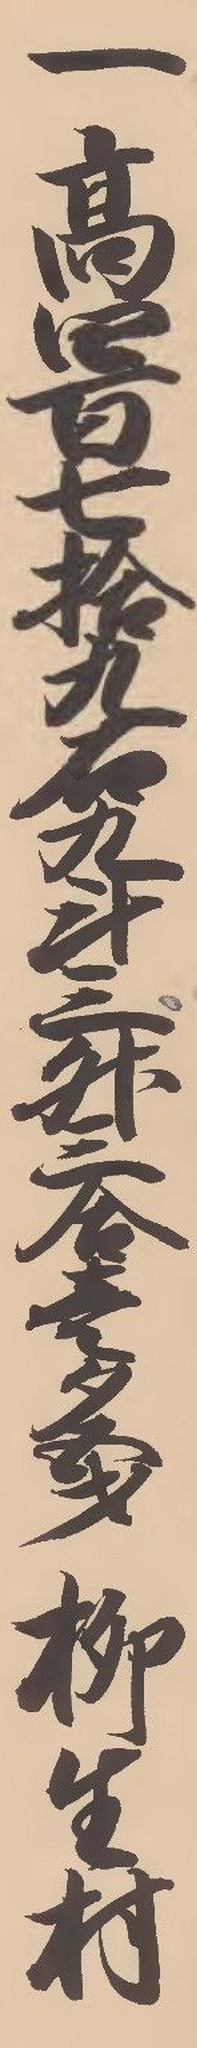一高四百七拾九石九斗三升三合壱勺五才柳生村

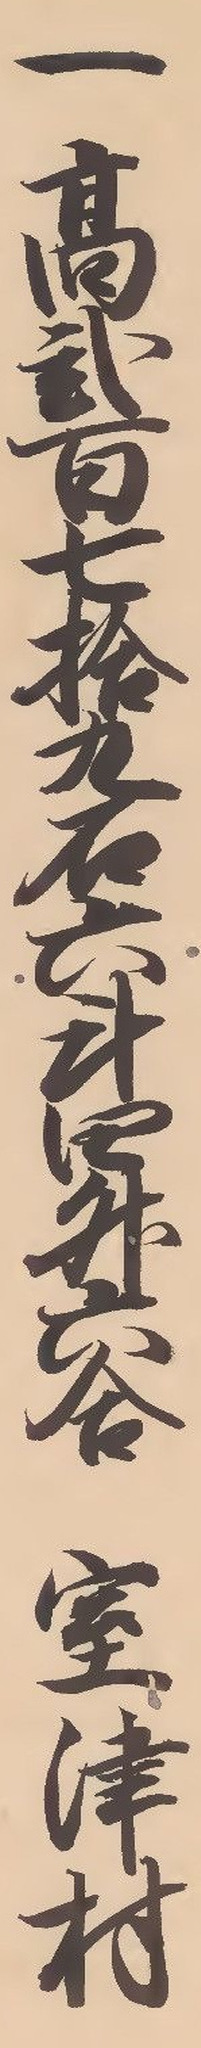一高弐百七拾九石六斗四升六合室津村
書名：大和国郷帳
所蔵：国立公文書館 National Archives of Japan
